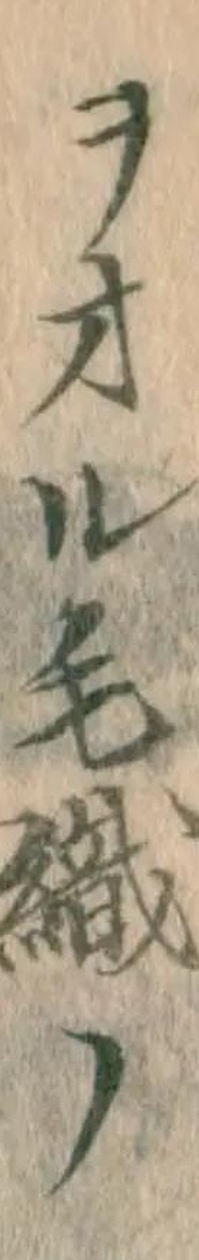ヲオル毛織ノ
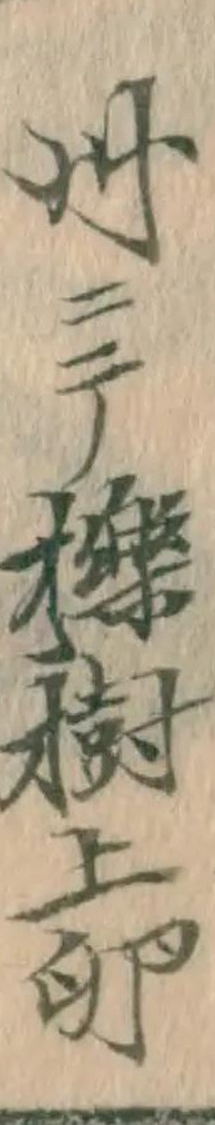州ニテ櫟樹上卵
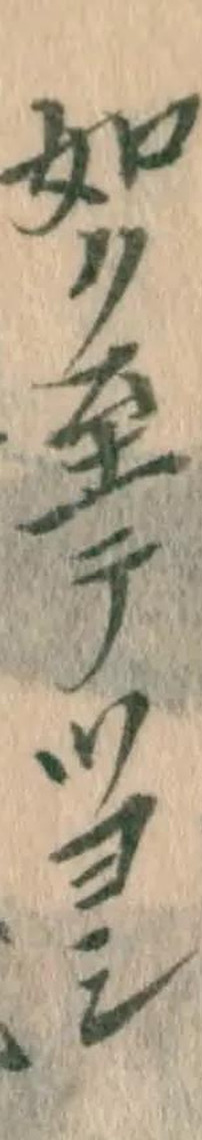如ク至テツヨシ
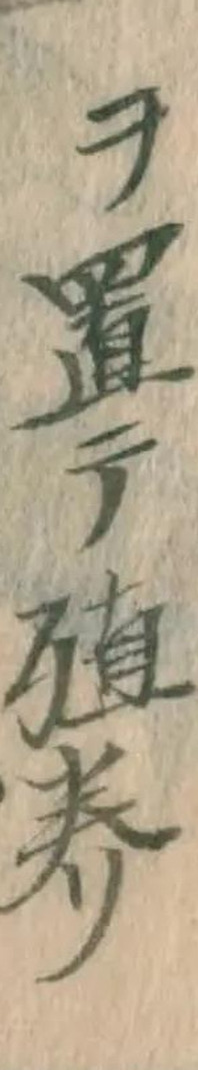ヲ置テ殖奍
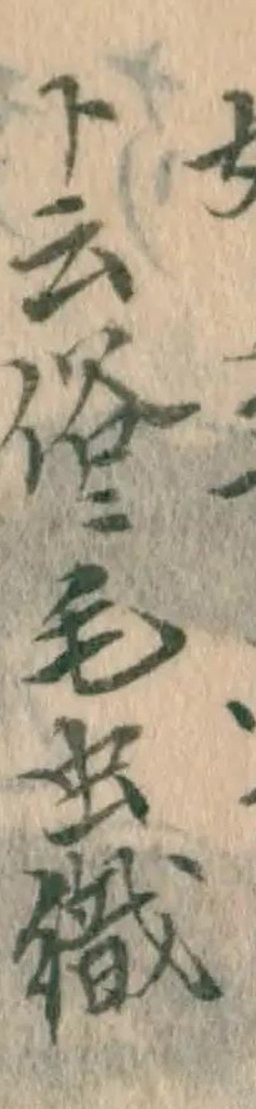ト云俗ニ毛虫織
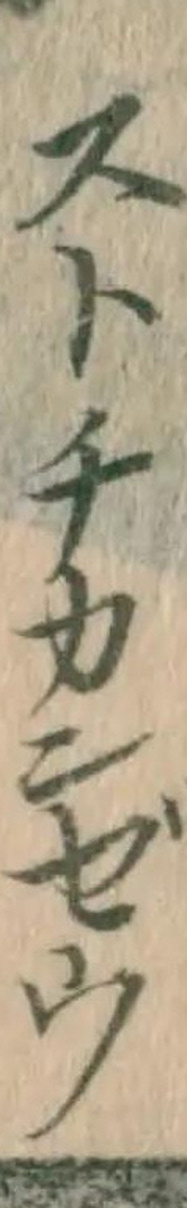ストチカンゼウ
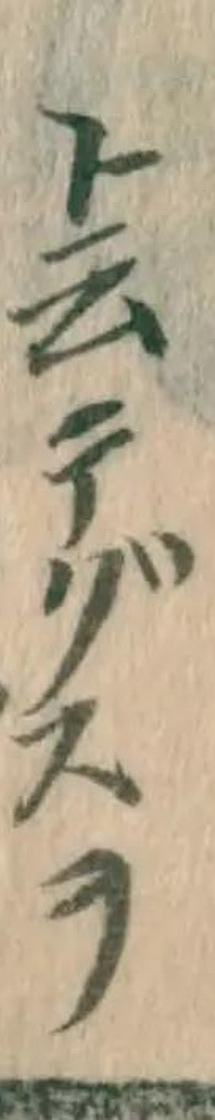ト云テグスヲ
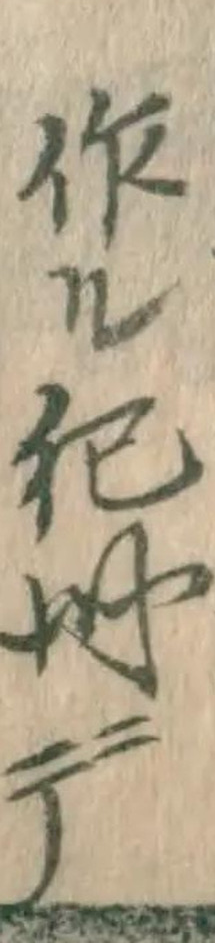作ル紀州ニテ
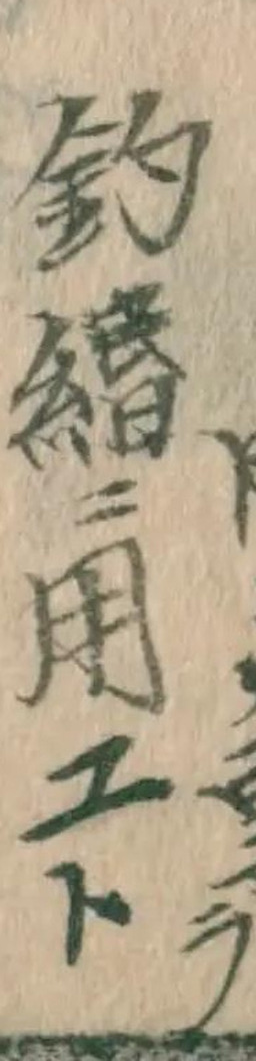釣緍ニ用ユト

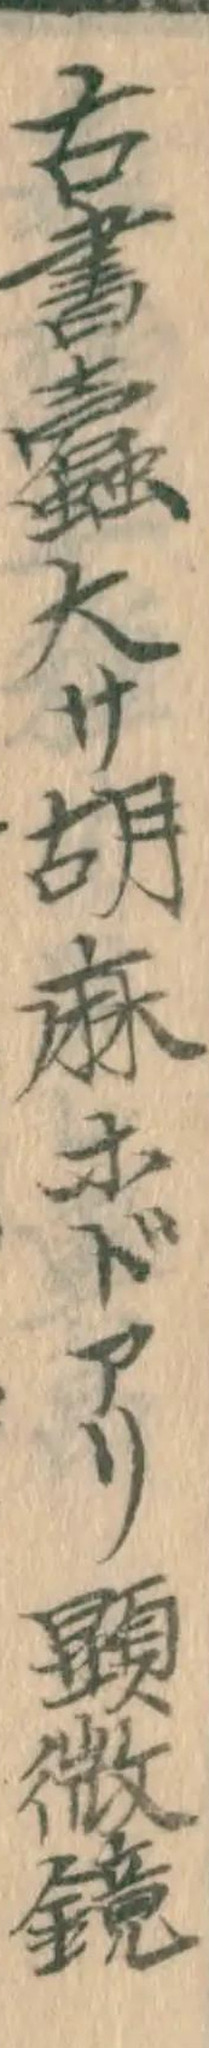古書蠹大サ胡麻ホドアリ顕微鏡
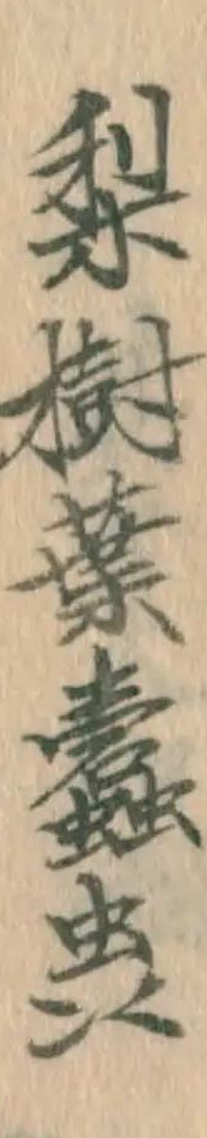梨樹葉蠹蟲
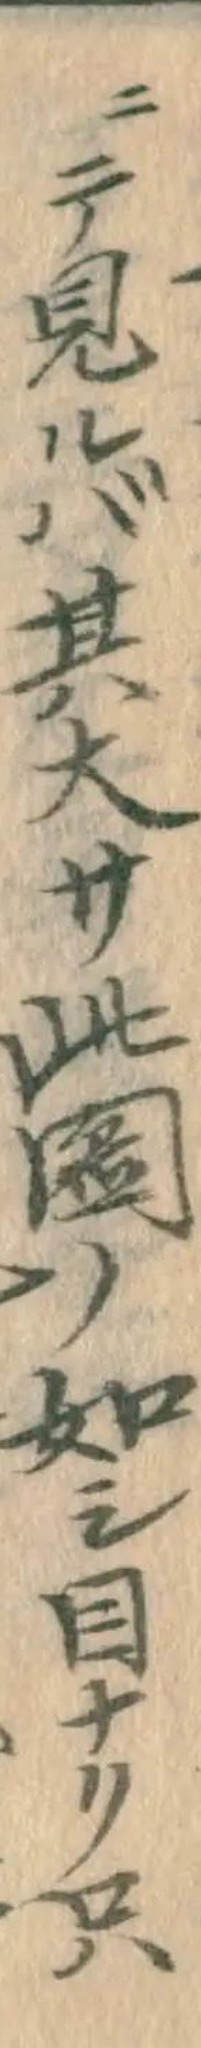ニテ見ルバ其大サ此圖ノ如シ目ナク只
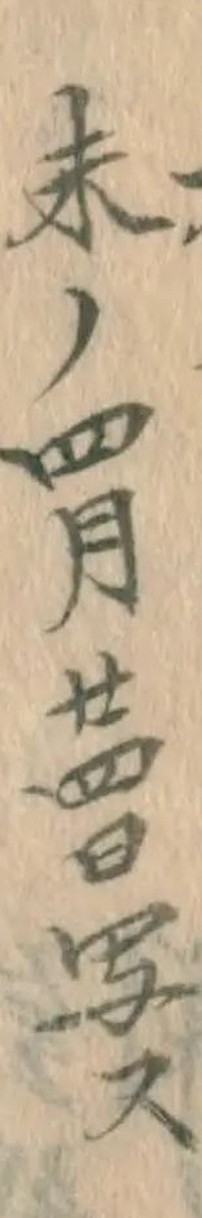未ノ四月廿四日写ス
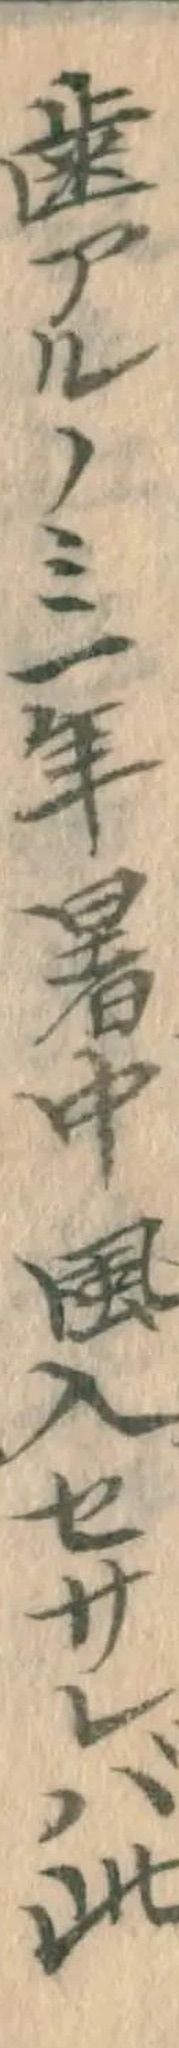歯アルノミ一年暑中風入セサレバ此
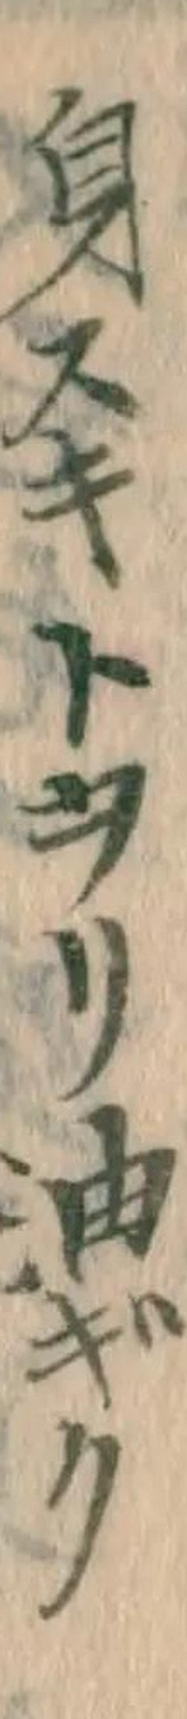身スキトヲリ油ギク
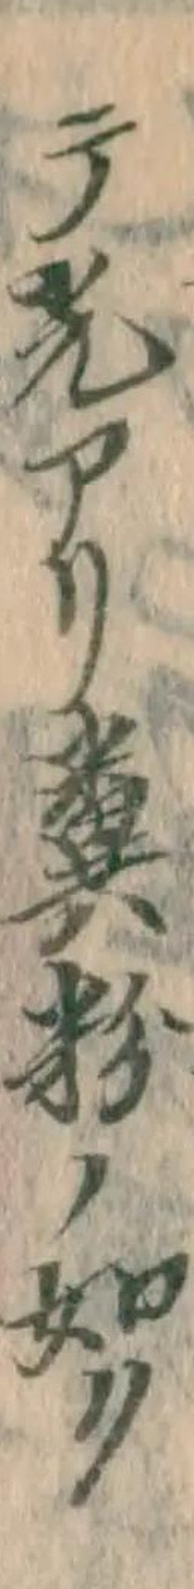テ光アリ糞粉ノ如ク
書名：千蟲譜 3巻. [2]
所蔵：国立国会図書館 National Diet Library, JAPAN
